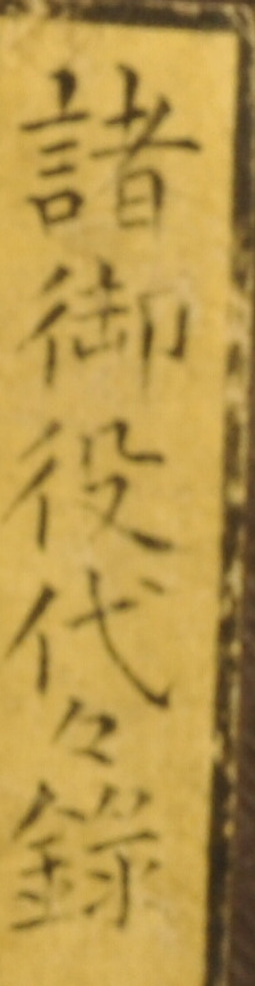諸御役代々録六

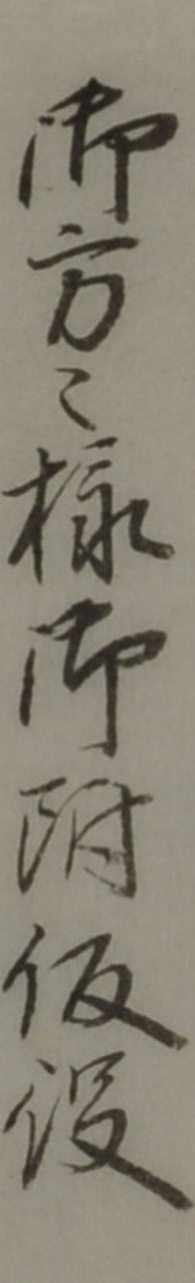御方々様御附仮役
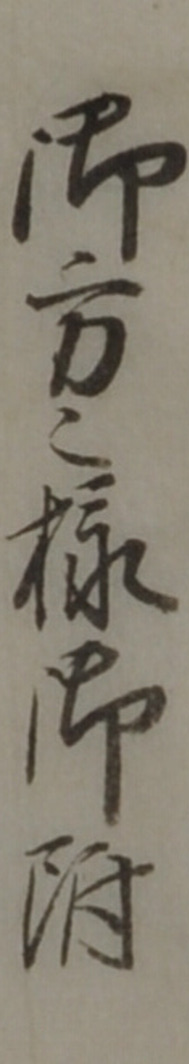御方々様御附
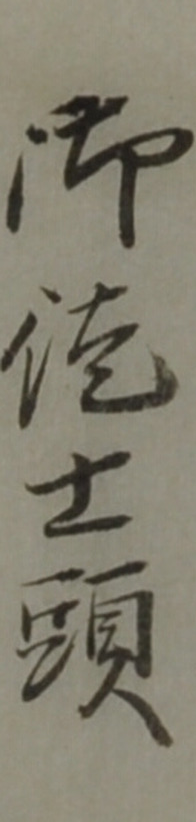御徒士頭
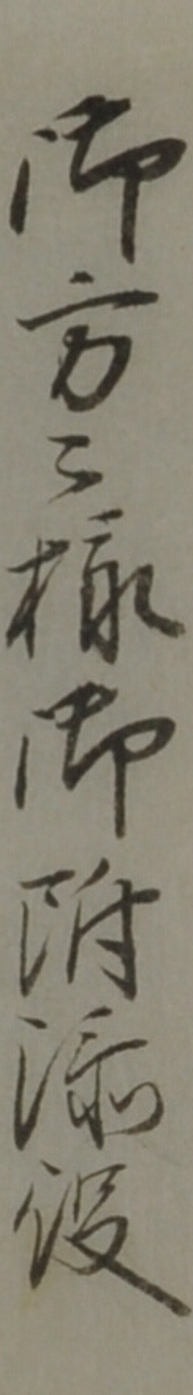御方々様御附添役
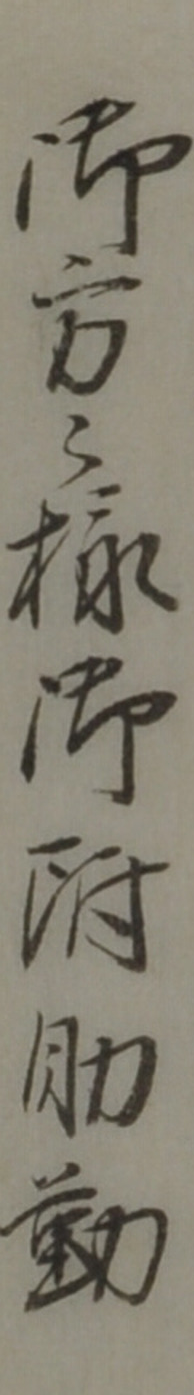御方々様御附助勤
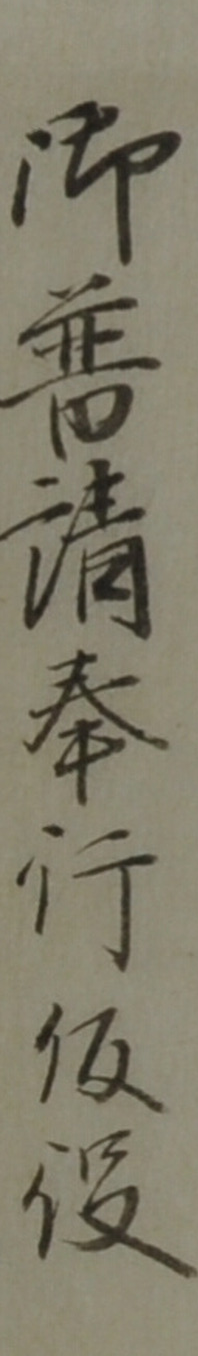御普請奉行仮役
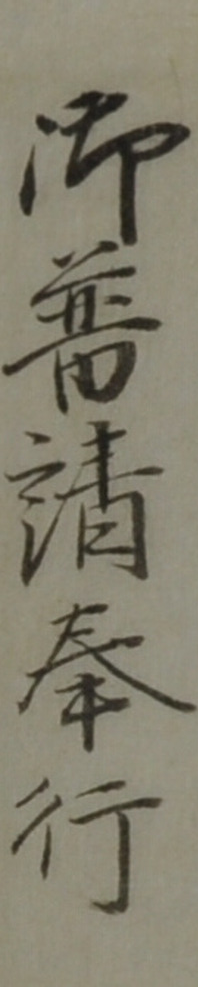御普請奉行
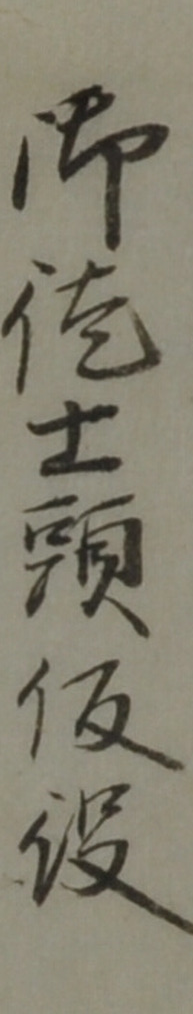御徒士頭仮役
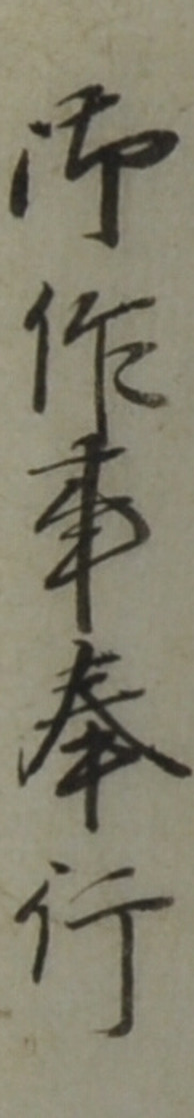御作事奉行
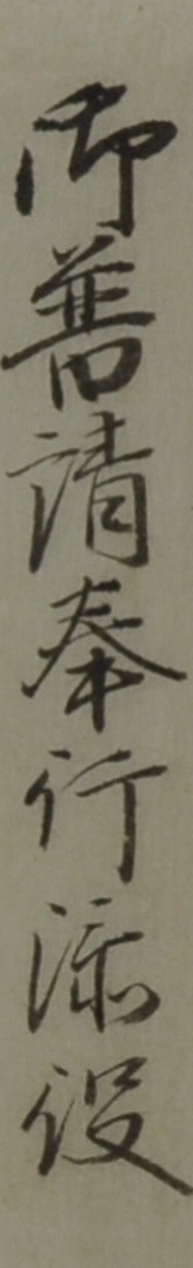御普請奉行添役

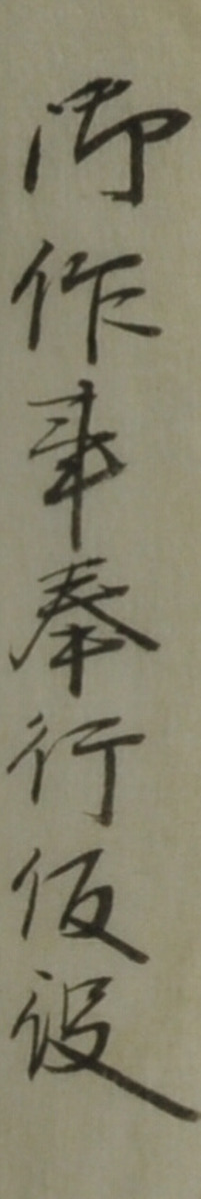御作事奉行仮役
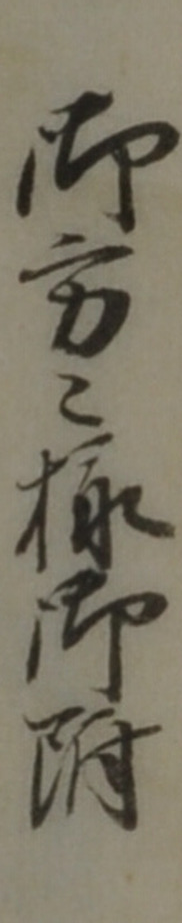御方々様御附
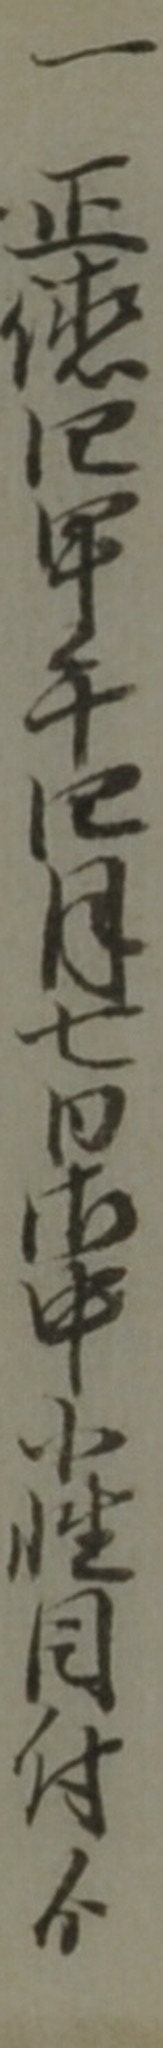一正徳四甲午四月七日御中小性目付ゟ
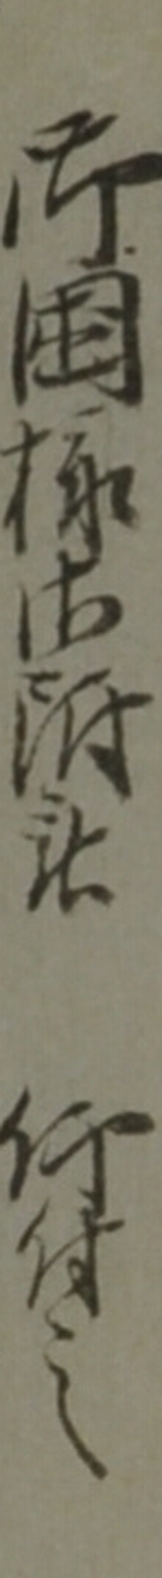御◻︎様御附被仰付之
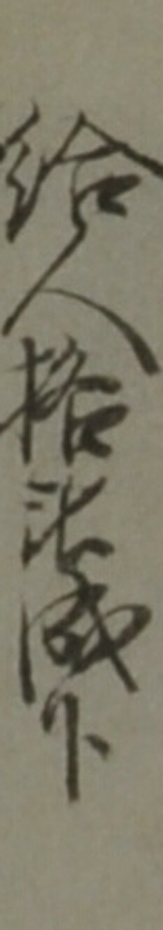給人格被成下
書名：諸御役代々録（六）
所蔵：伊那市立高遠町図書館・合同会社AMANE
